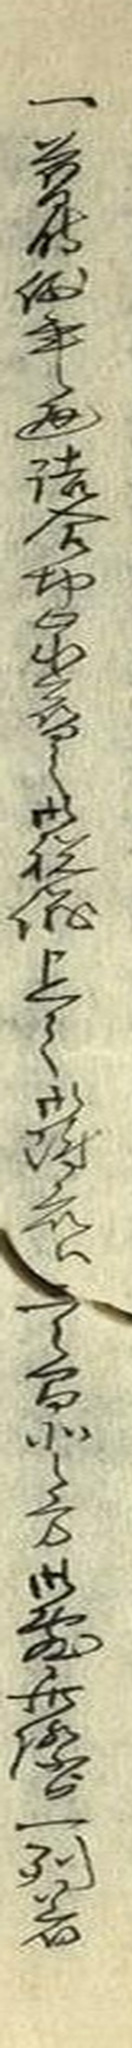一暮時例年之通詰合切歳暮之御祝儀申上之御附衆ハ三之間北之方御敷居際ゟ一列着
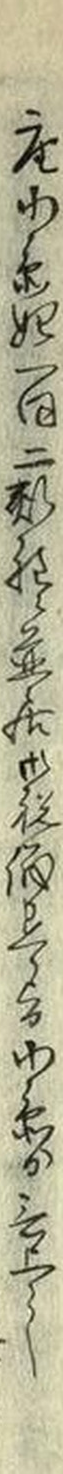座小兵衛始一同二頬程ニ並居御祝儀申上候旨小兵衛ゟ言上之
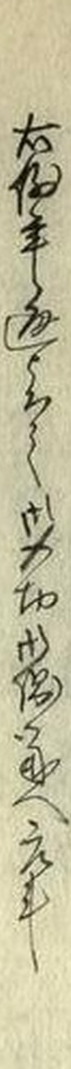右例年之通被下之御〆切御側御用人取計
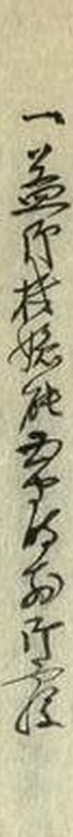一益御機嫌能五半時前御寝
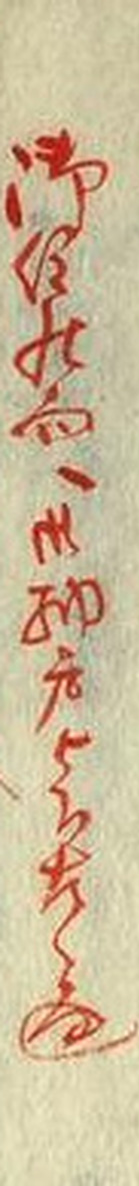御住居向へ御納戸被下左之通
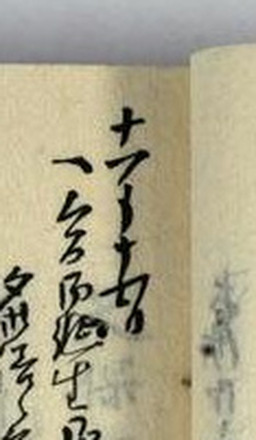十一月十五日
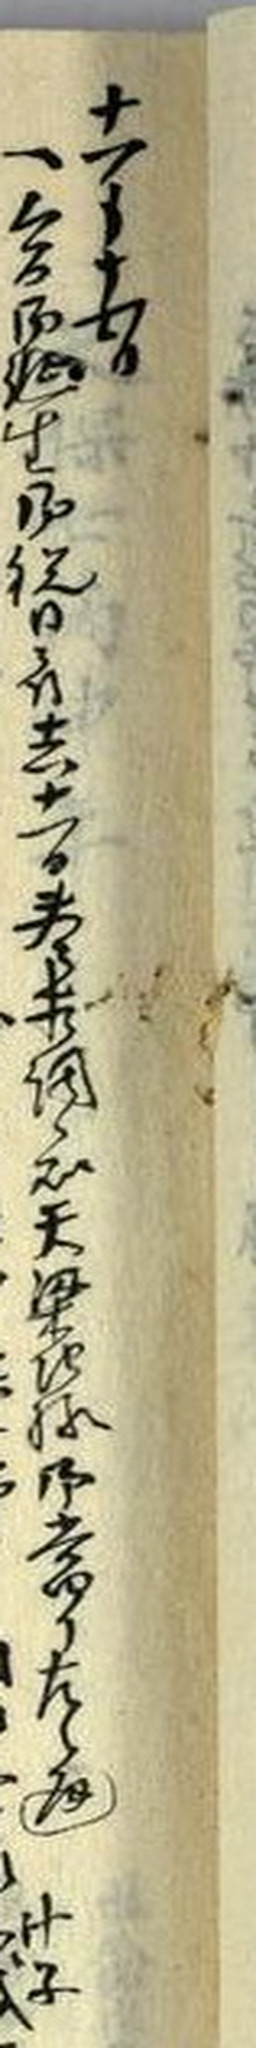一今日御誕生御祝日ニ付去十一日夫々相調候処天梁院様御当り左之通
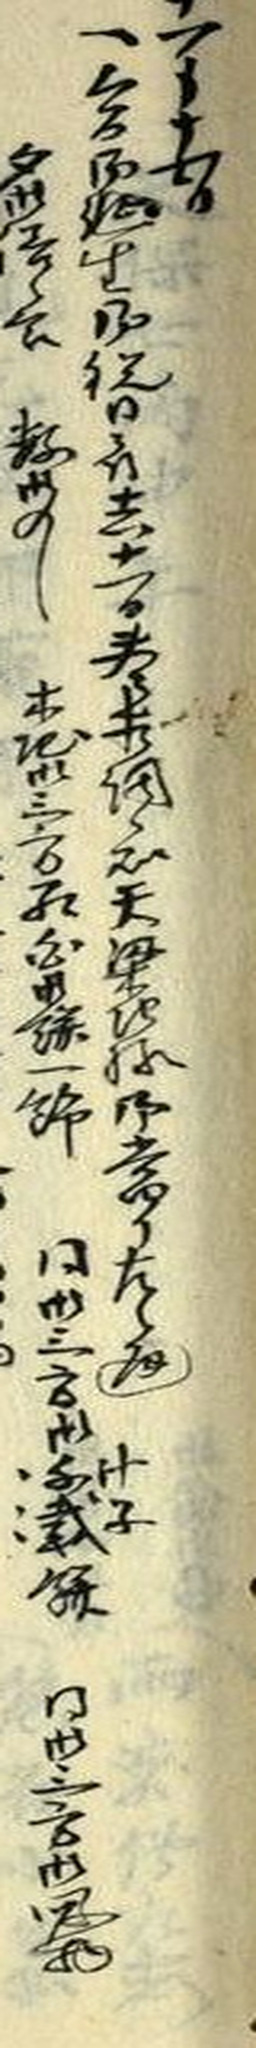夕御膳之節数御のし木地御三方紅白御餅一飾同御三方御千載餅同御三方御吸物
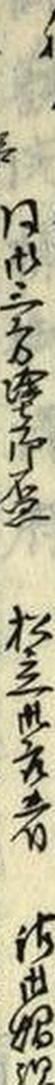同御三方塗御盃松立御取肴銀御燗鍋
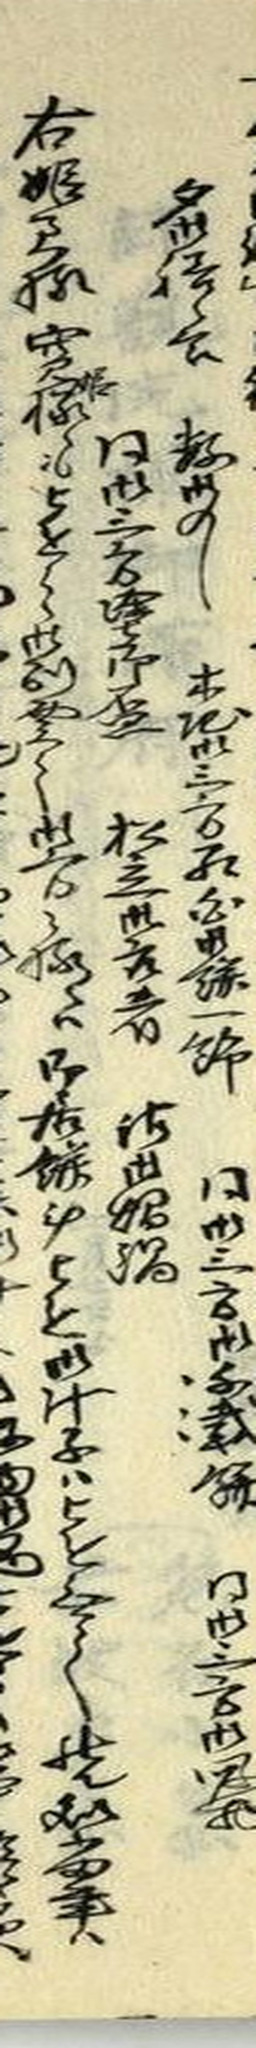右姫君様寛姫様へも被進之御別殿之御方々様ヘハ御居餅斗被進御汁子ハ被進無之然ル処当年ハ
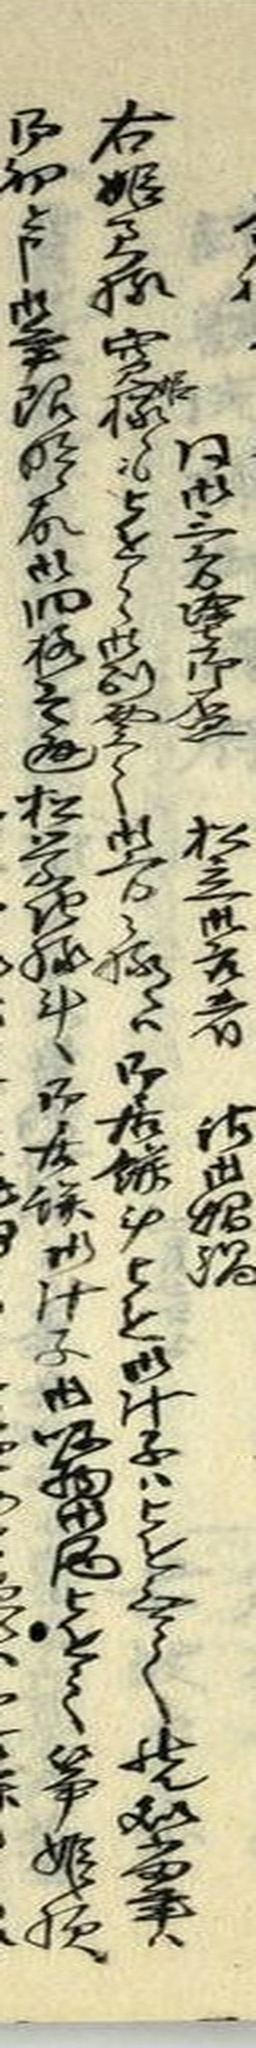御初と申御年限明候故御旧格之通松栄院様斗へ御居餅御汁子御吸物御酒被進之箏姫様
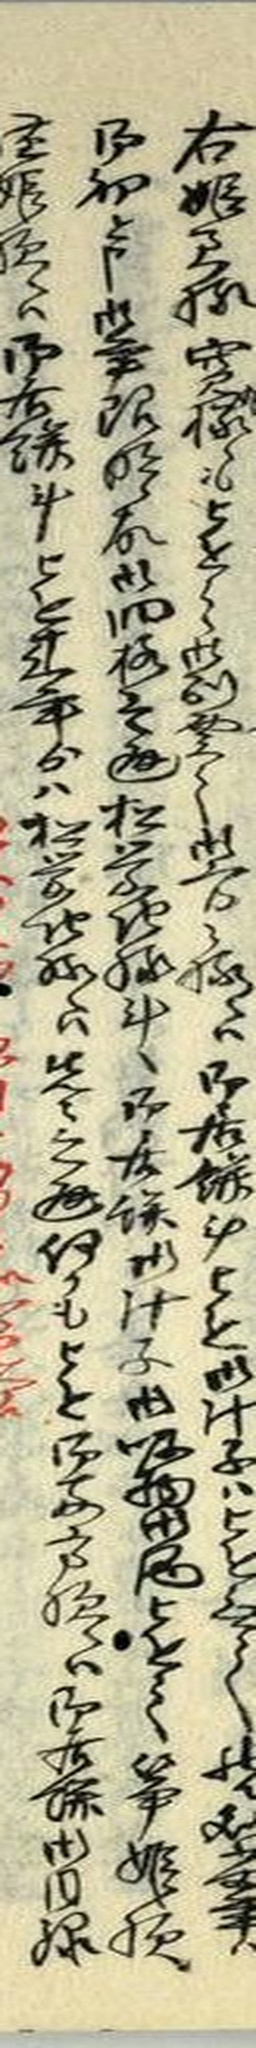謹姫様ヘハ御居餅斗被進来年ゟハ松栄院様ヘハ先々之通何かも被進御両方様ヘハ御居餅御目録

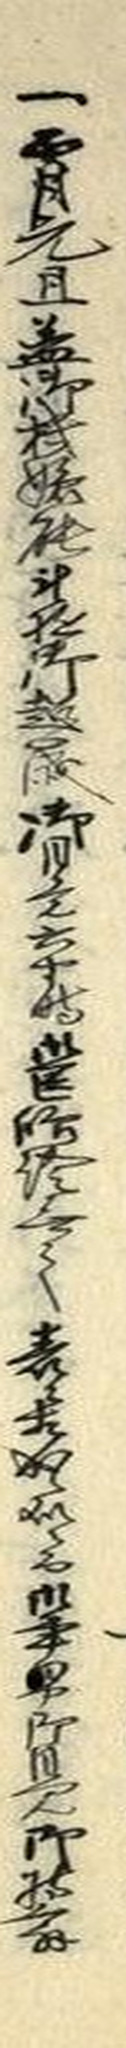一正月元旦益御機嫌能被遊御超歳御目覚六半時御医師診無之表ニ相成候処ニ而御年男御目見御持扇
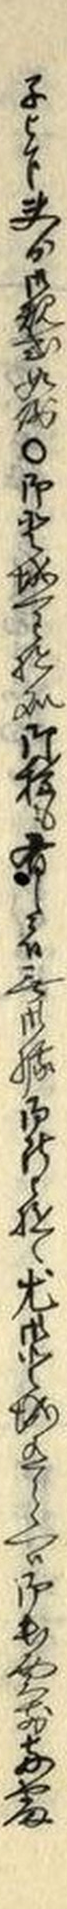子被下夫ゟ御規式如例〇御登城可被遊処御移も有之ニ付無御拠御断被遊候尤御登城有之候ヘハ御出殿前両番
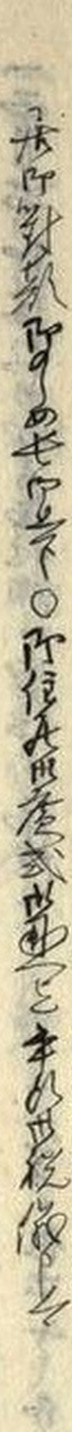居御対顔御のしめ長御上下〇御住居御広式御用人迄年頭御祝儀申上候
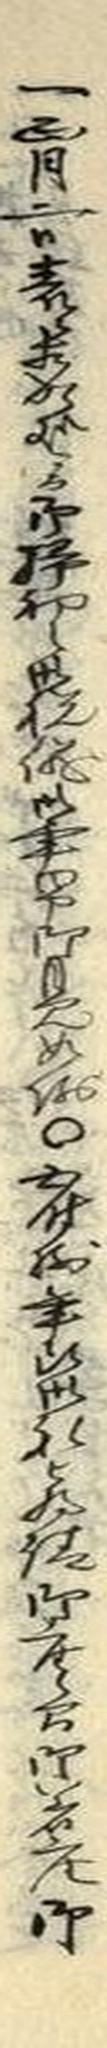一正月二日表ニ相成候処ニ而御掃初之御祝儀御年男御目見如例〇五時揃年頭御礼被為請御座之間御着座御
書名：少傅日録抄（斉善付側向頭取日記、在府）
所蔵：福井県文書館 Fukui Prefectural Archives
